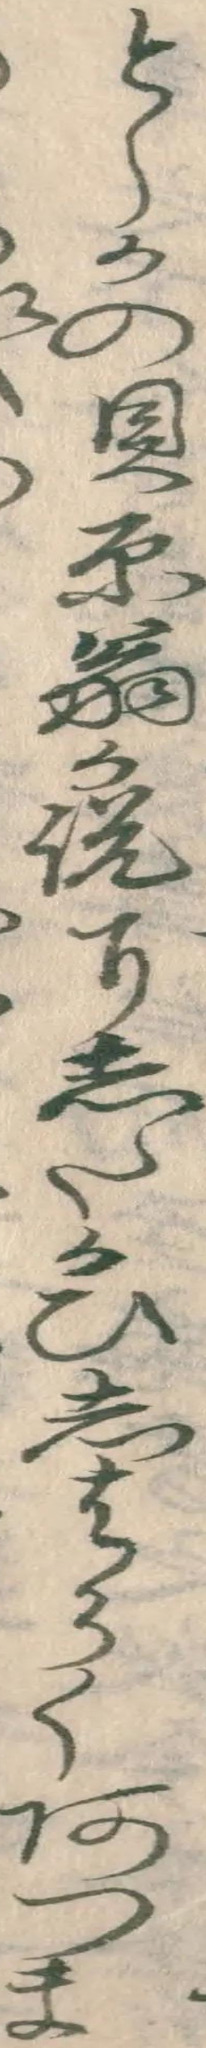としかの貝原翁か説にしたかひしはらくあつま
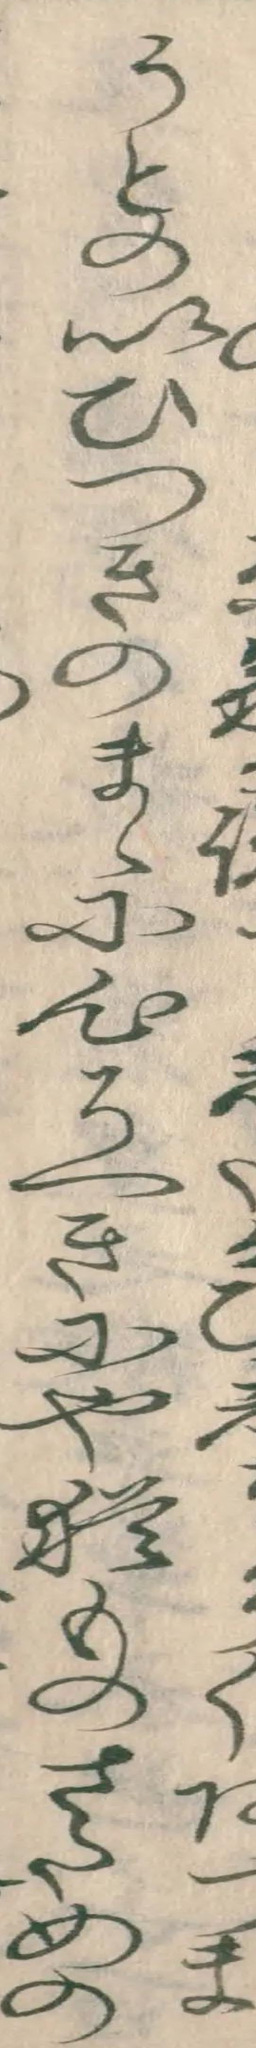うとのいひつきのまゝに心うへきにや猶ものさための
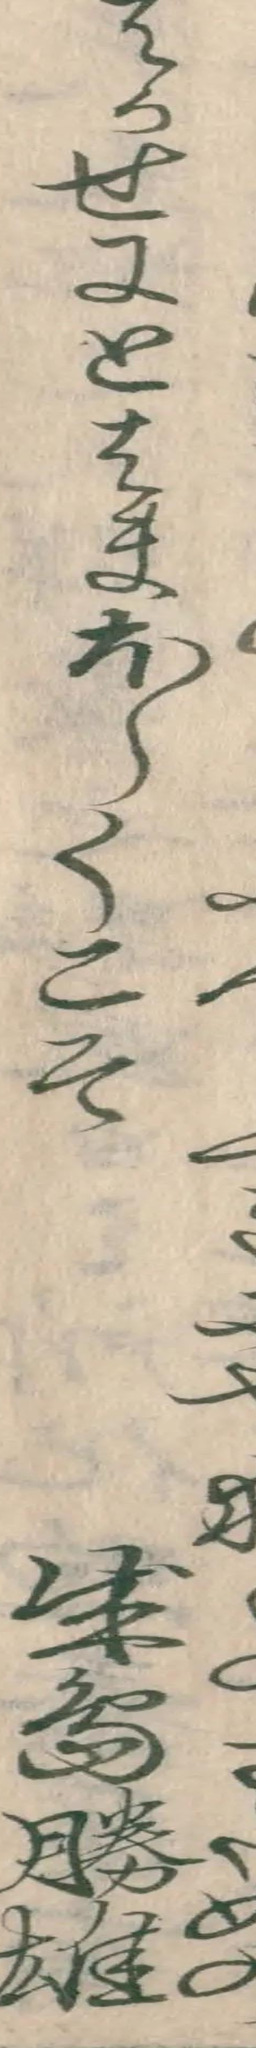はかせにとはまほしくこそ成島勝雄

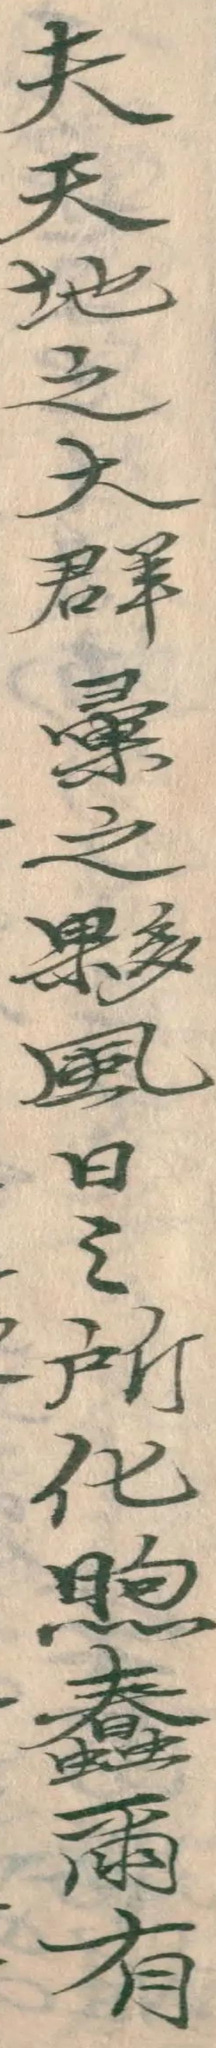夫天地之大群彙之夥風日之所化煦蠢爾有
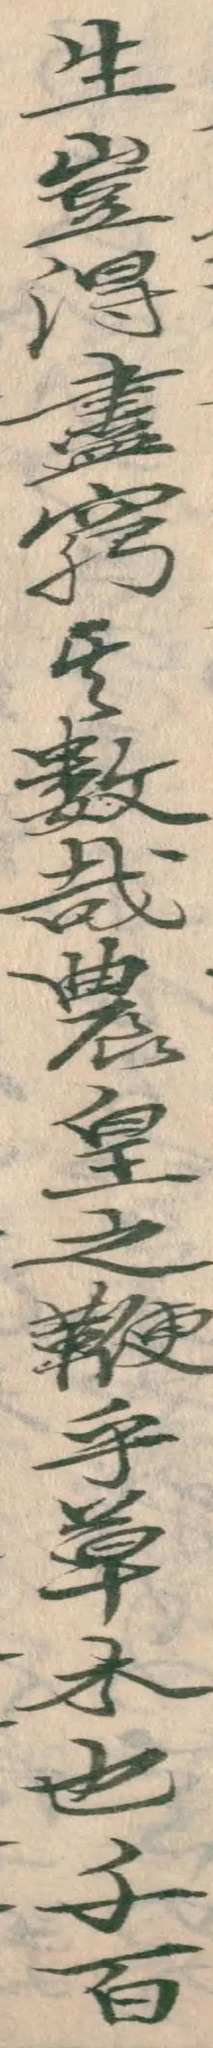生豈得盡窮其数哉農皇之鞭乎草木也千百
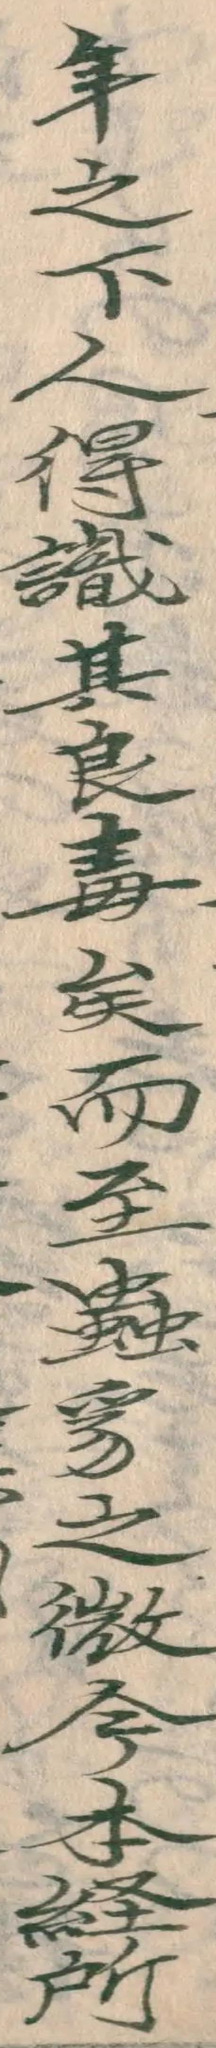年之下人得識其良毒矣而至蟲豸之微今本経所
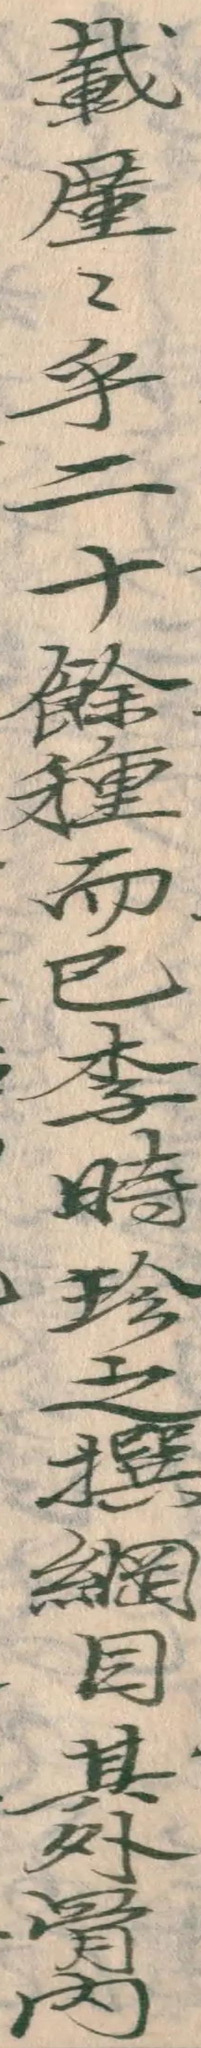載厪々乎二十餘種而已李時珍之撰綱目其外骨内
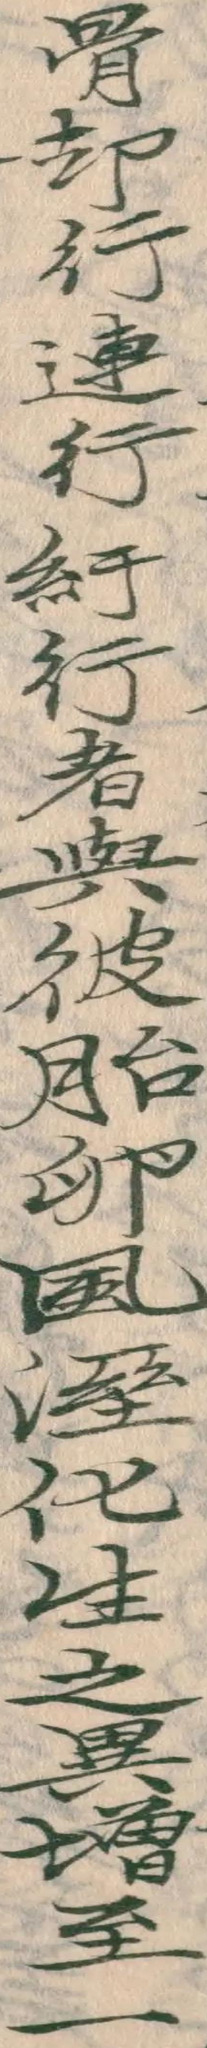骨却行連行紆行者與彼胎卵風溼化生之異増至一
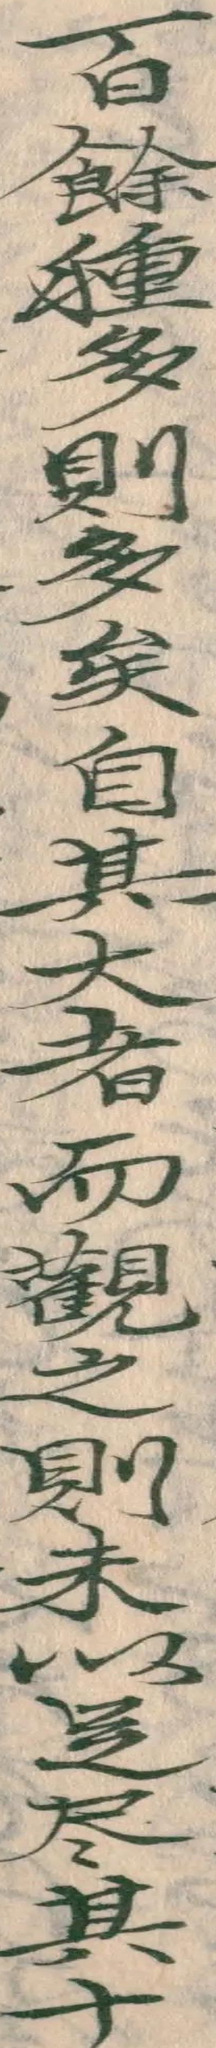百餘種多則多矣自其大者而観之則未以足尽其十
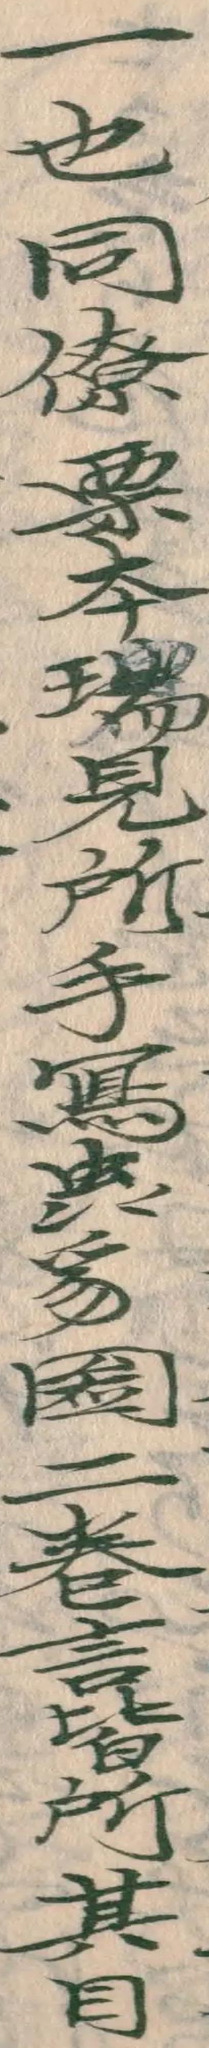一也同僚栗本瑞見所手写蟲豸図二巻言皆所其目
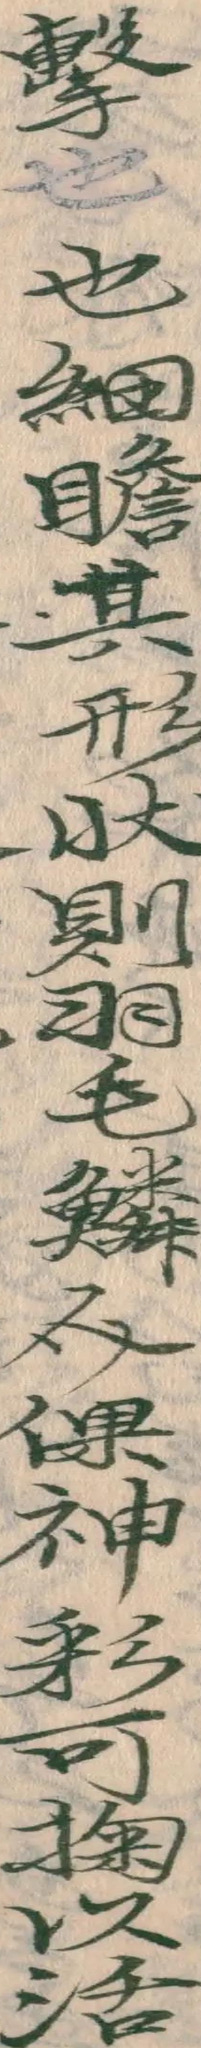撃也細瞻其形状則羽毛鱗介倮神彩可掬以活
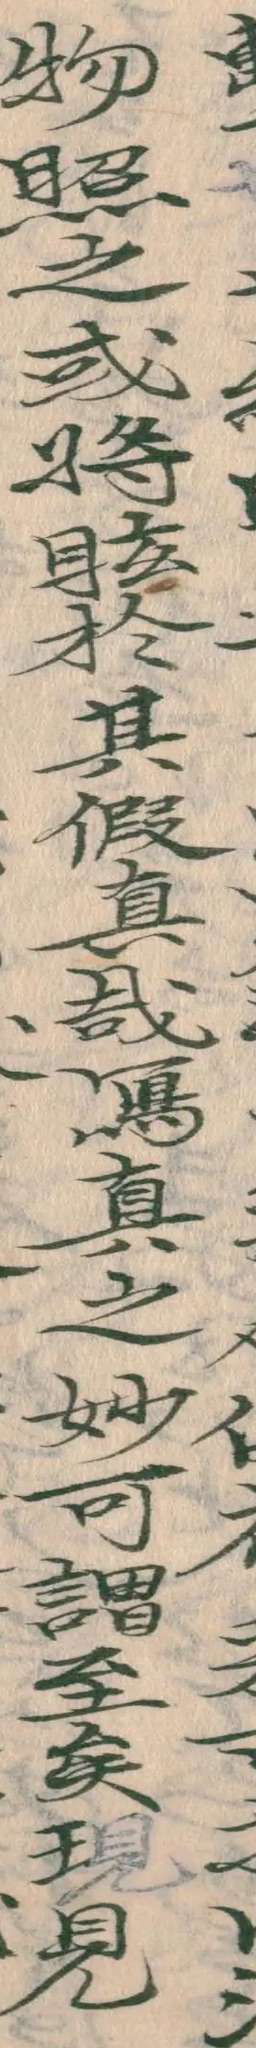物照之或将眩於其假真哉写真之妙可謂至矣見
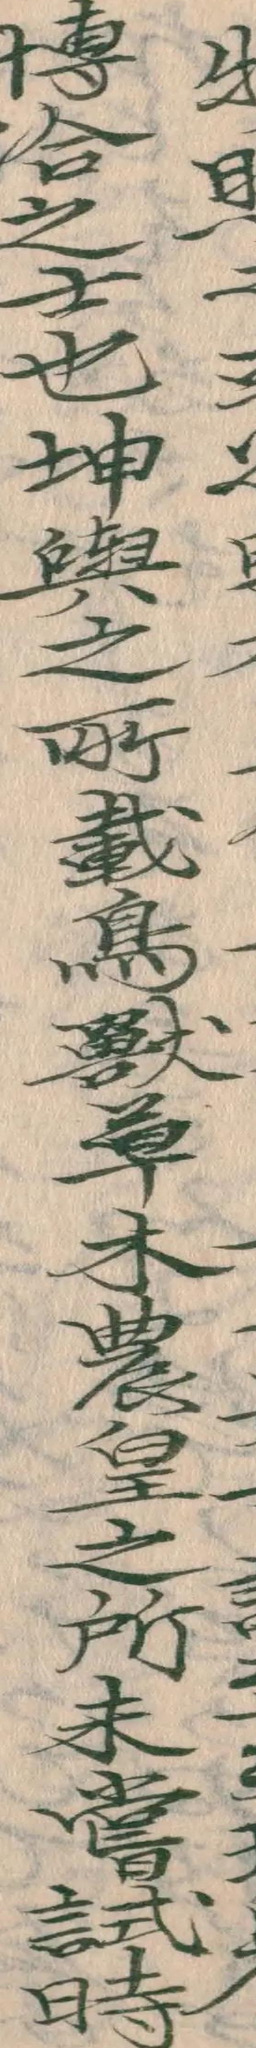博洽之士也坤輿之所戴鳥獣草木農皇之所未嘗試時
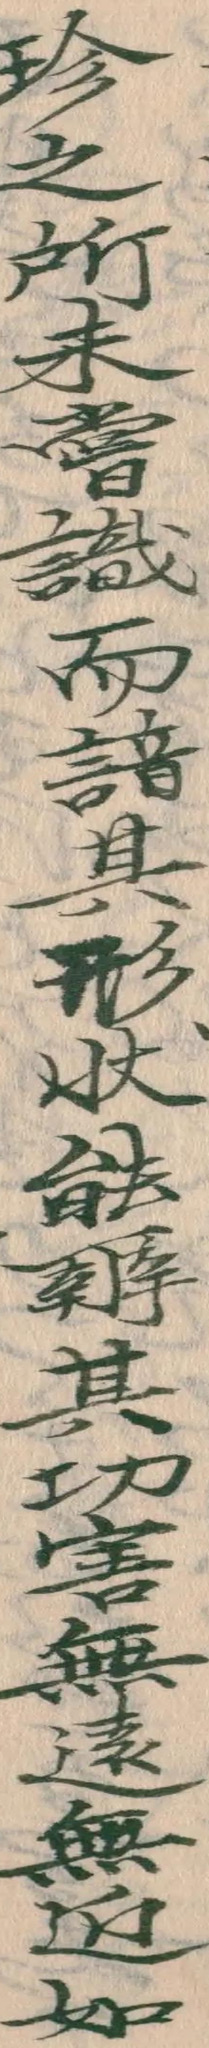珍之所未嘗識而諳其形状能其功害無遠無近如
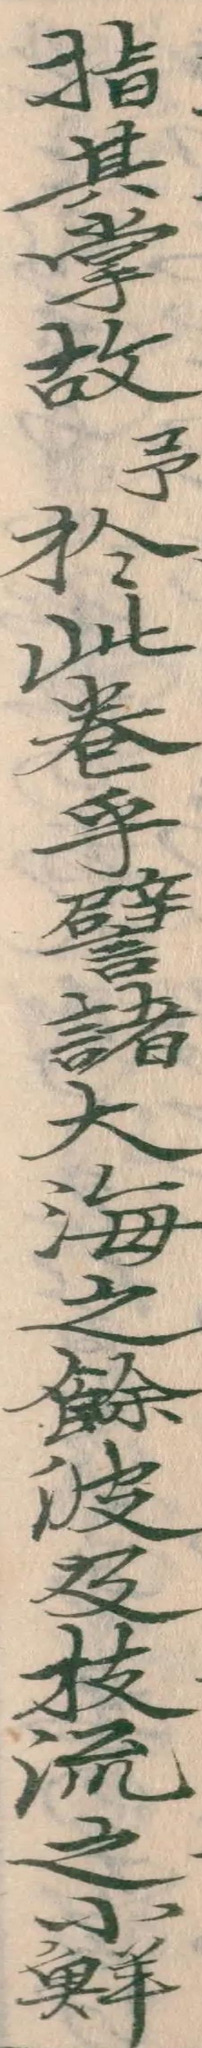指其掌故予於此巻乎譬諸大海之餘波及枝流之小鮮
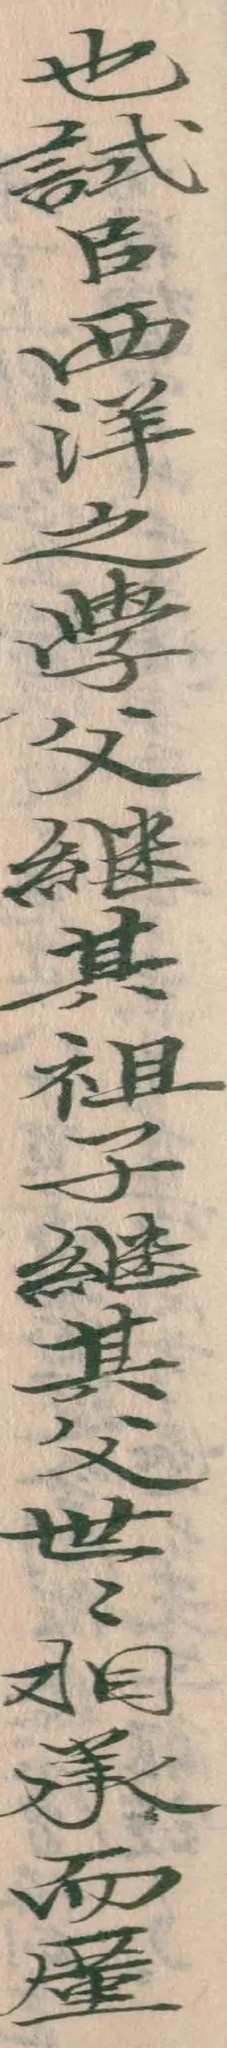也試㠯西洋之学父継其祖子継其父世々相承而厪
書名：千蟲譜 3巻. [3]
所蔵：国立国会図書館 National Diet Library, JAPAN
